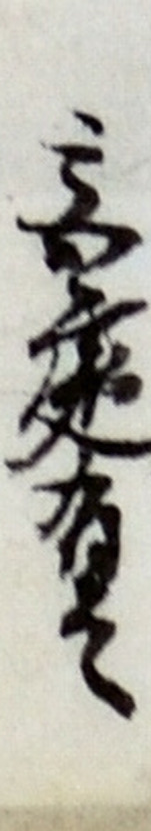宮建有之
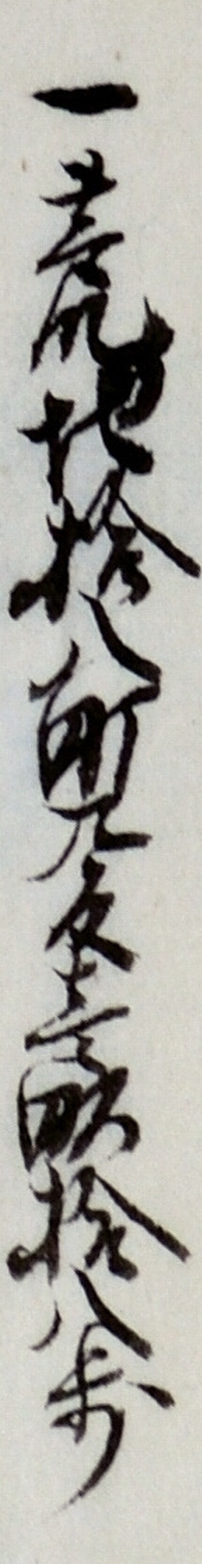一荒地拾八町九反壱畝拾八歩村中
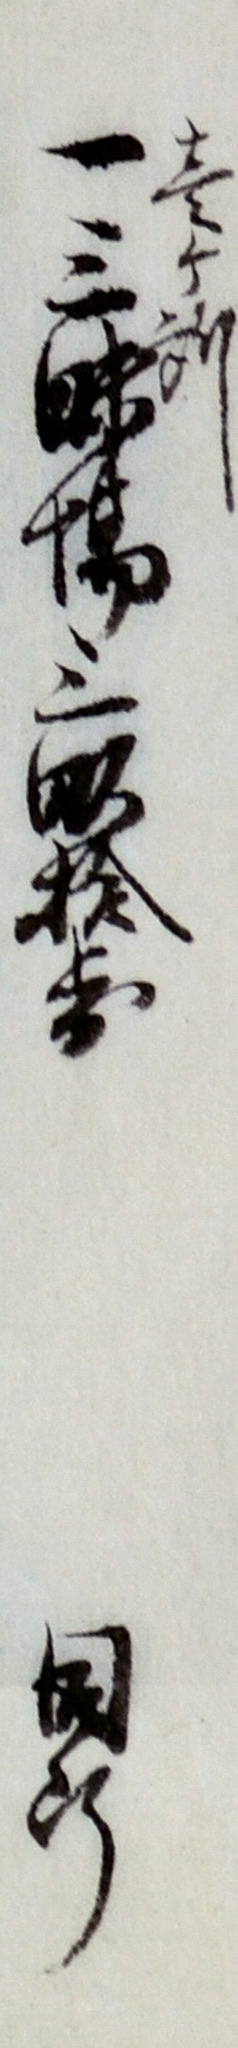一三昧場三畝拾歩同断

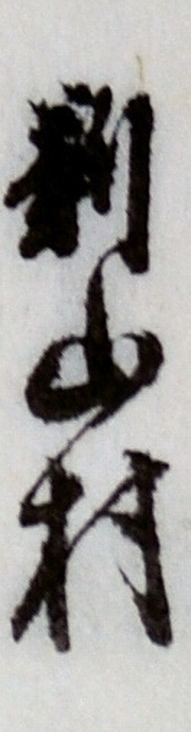新山村
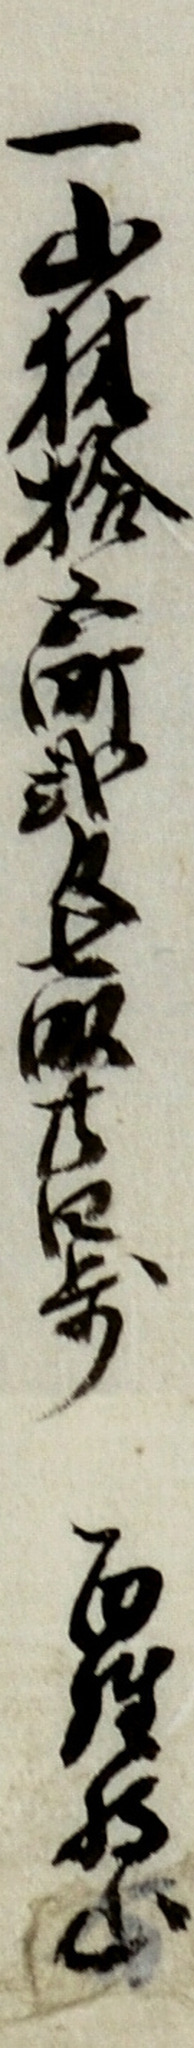一山林拾五町弐反七畝廿四歩百姓持山
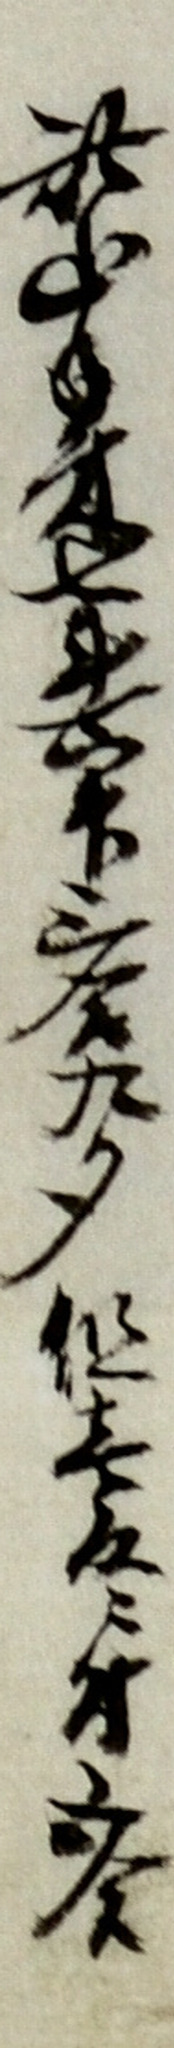此山手米七斗六升三合九勺但壱反ニ付五合

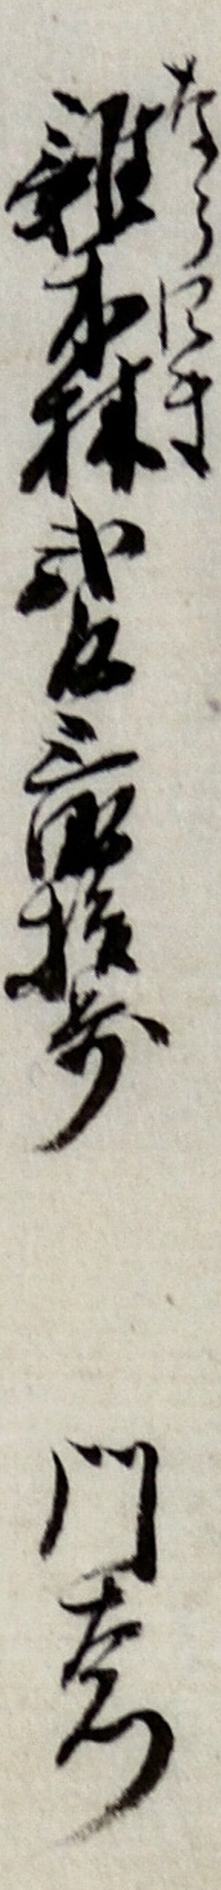雑木林弐反三畝拾歩門右衛門
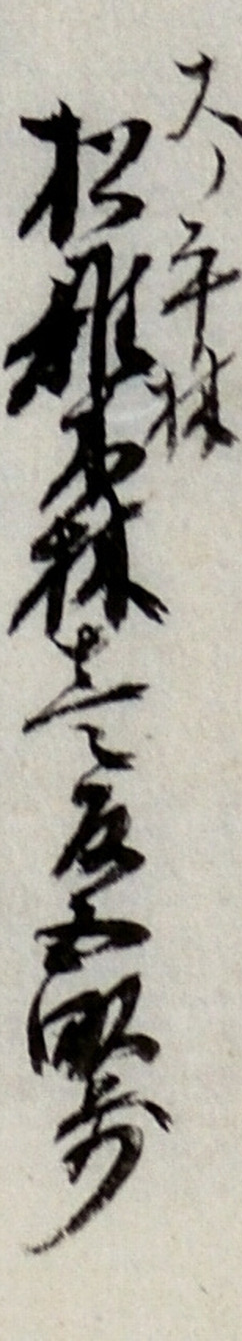松雑木林壱反五畝歩長蔵
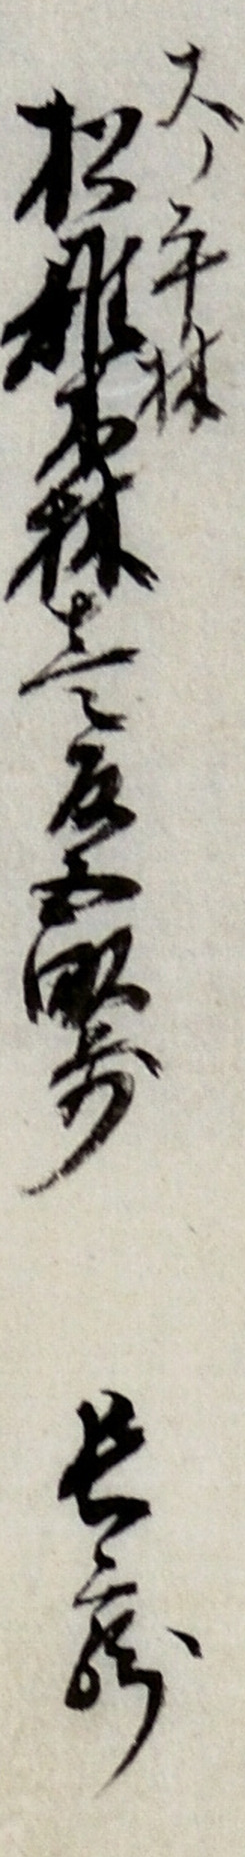松雑木林壱反五畝歩長蔵
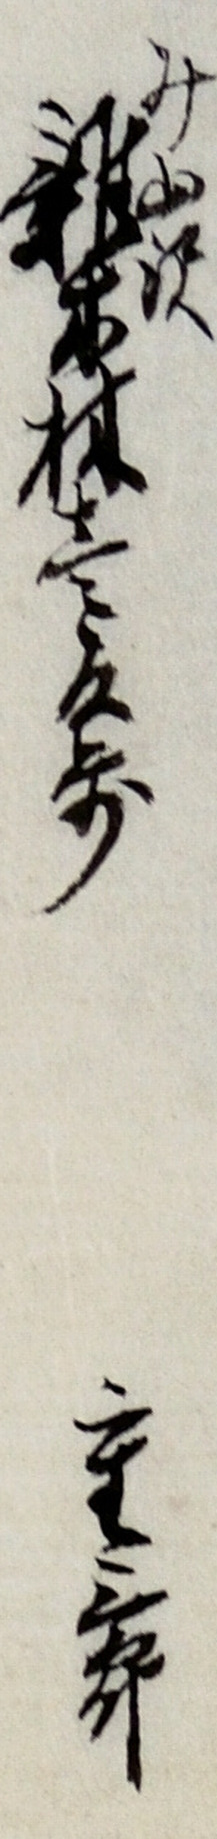雑木林壱反歩重三郎
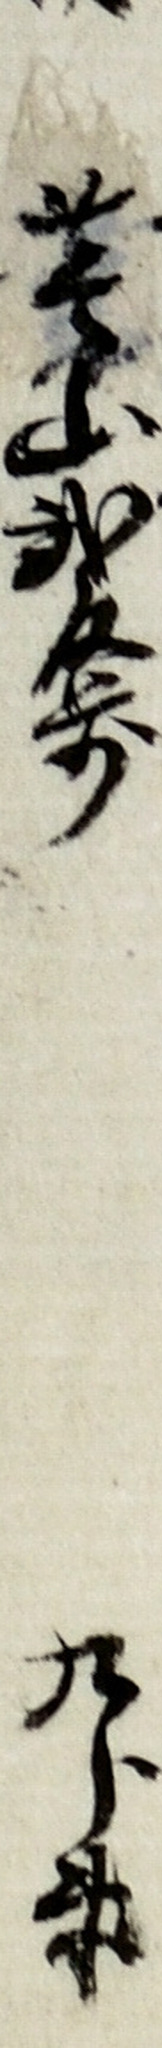後芝山弐反歩九郎兵衛
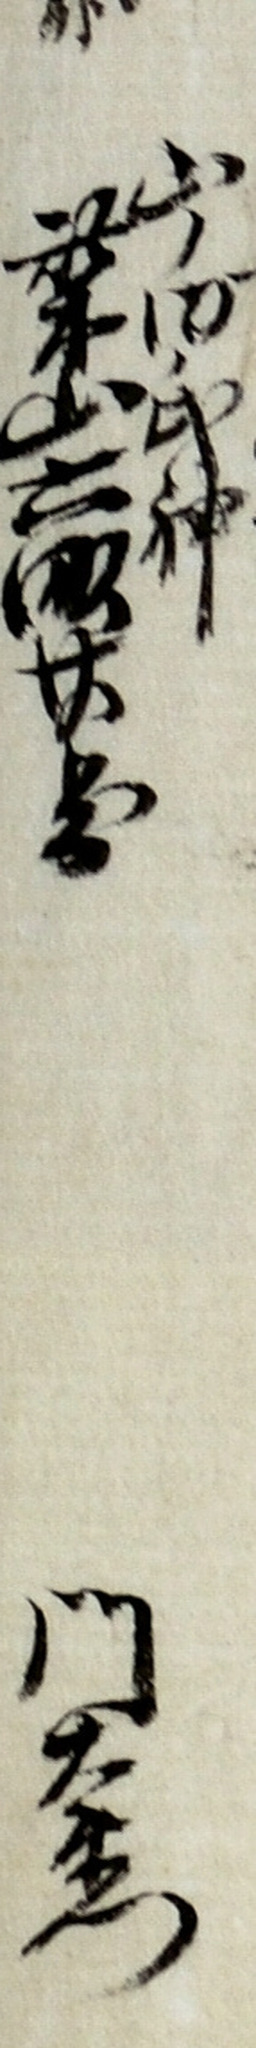前柴山六畝廿歩門右衛門
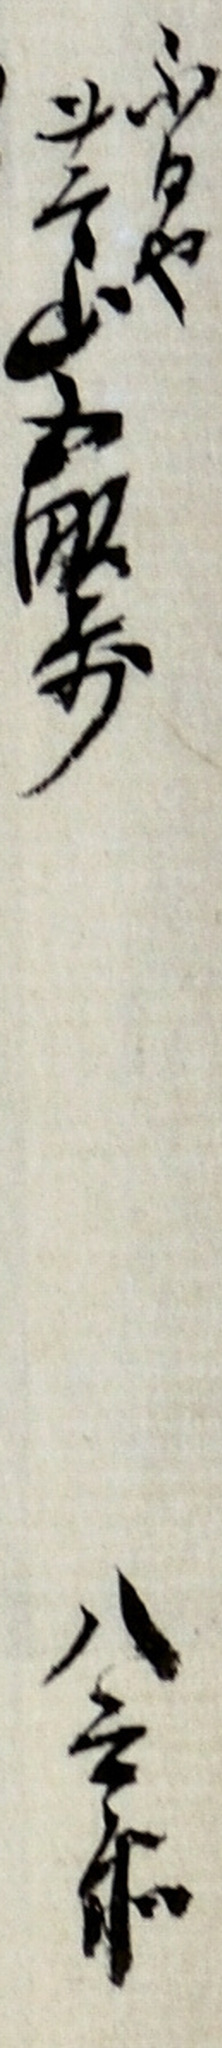芝山五畝歩八兵衛
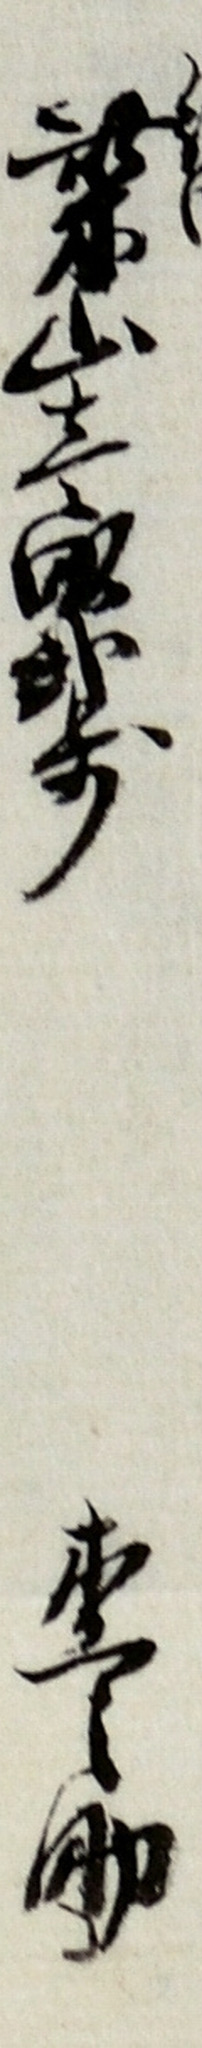柴山壱畝弐歩杢之助
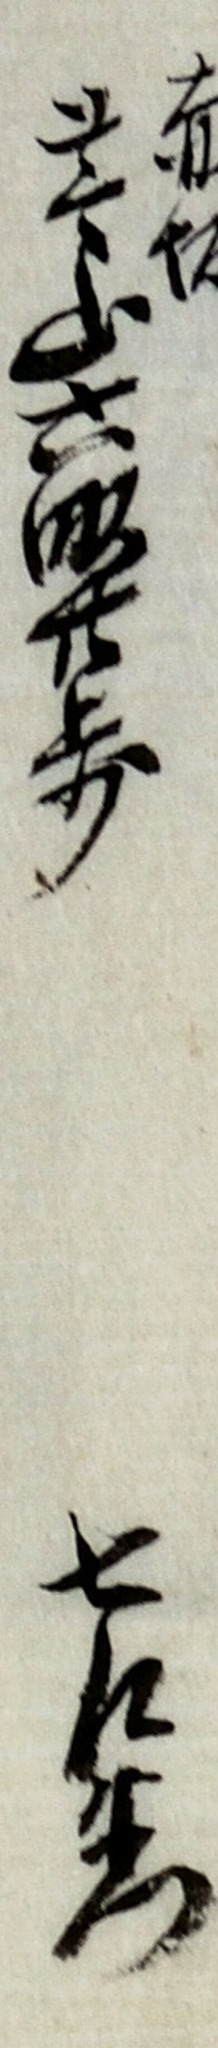芝山六畝廿歩七左衛門
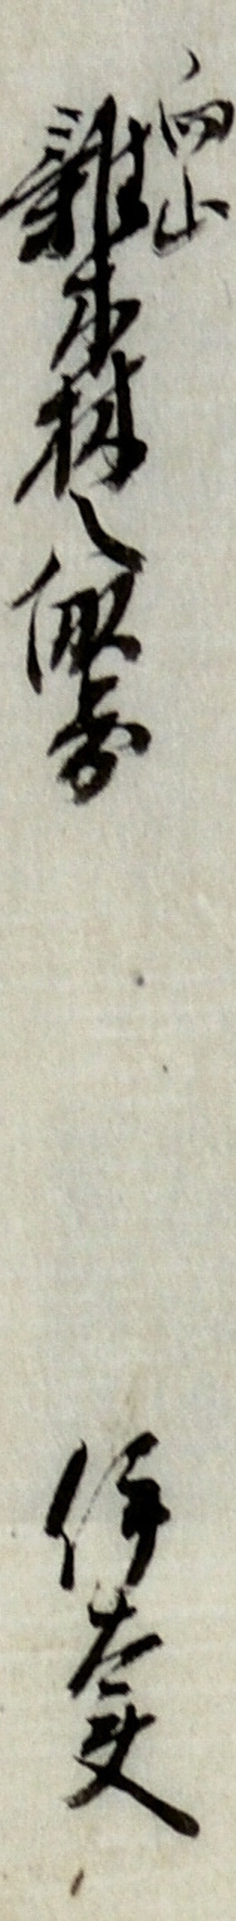雑木林八畝歩伊太夫
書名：御領分中山林社地手控
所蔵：伊那市立高遠町図書館・合同会社AMANE
